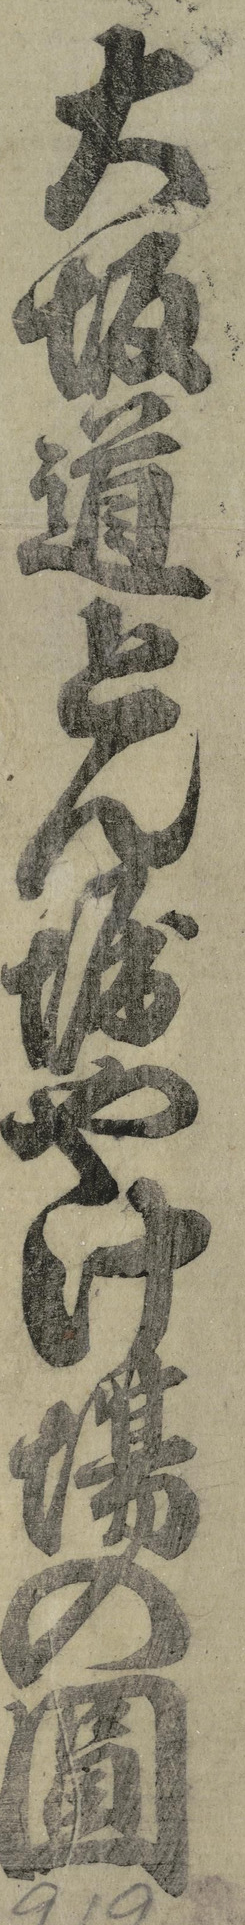大坂道とん堀やけ場の圖
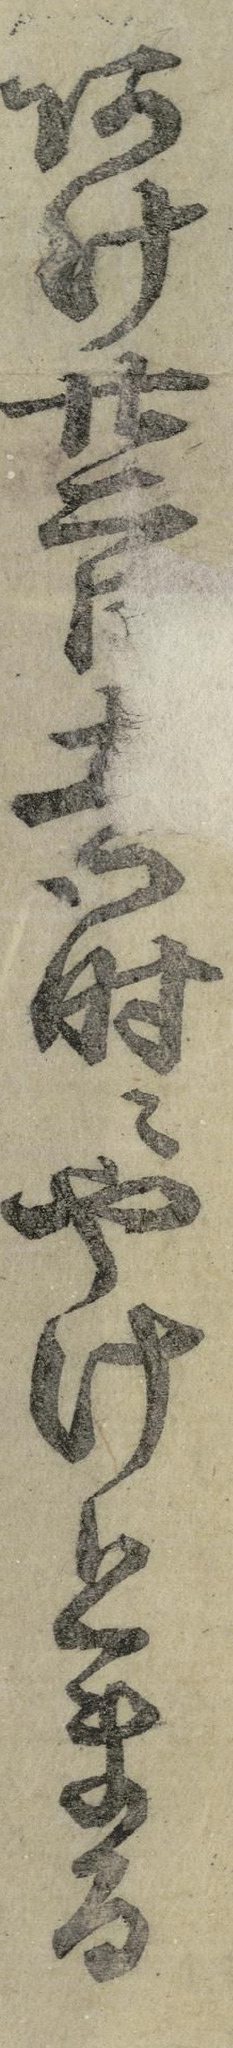あけ廿二日ツ時にやけとまる
